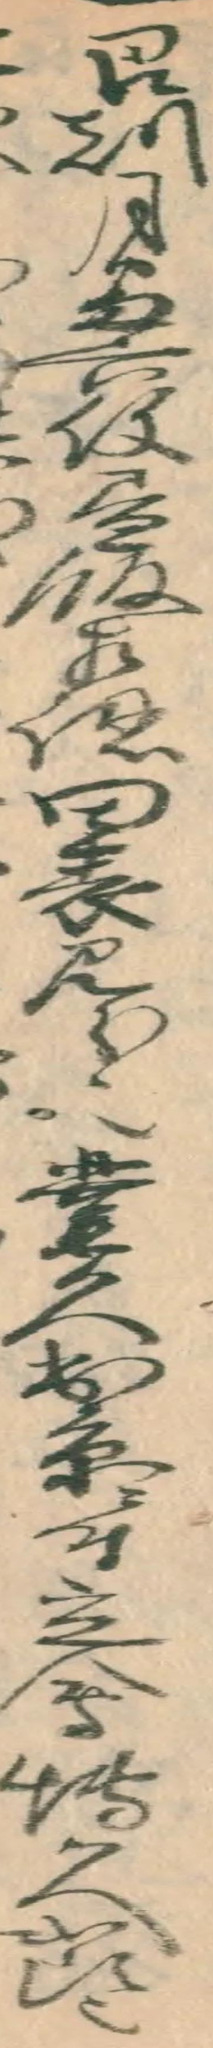一即刻月番六役昼飯相認田表見分也業久出京ニ付立会博久出頭也
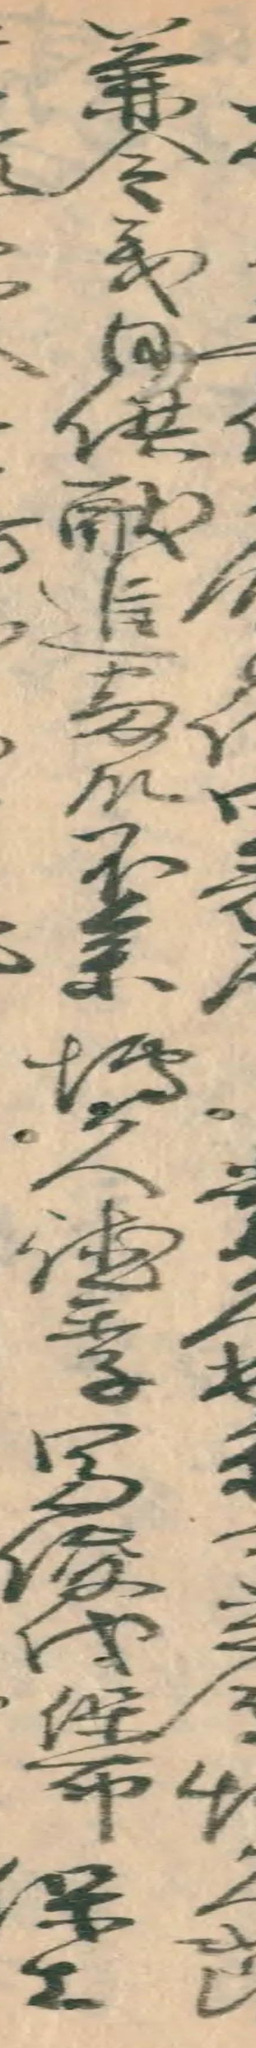兼令義日供献進番故不参博久徳季富俊代保布保土
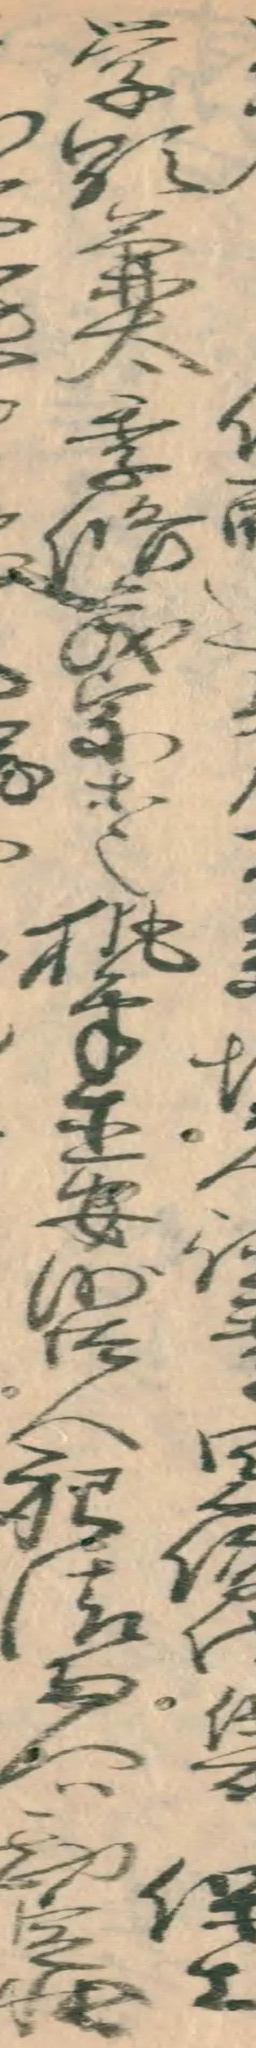学顕兼太季脩茂宗等也執筆直安沙汰人躬清両人ハ勘定状
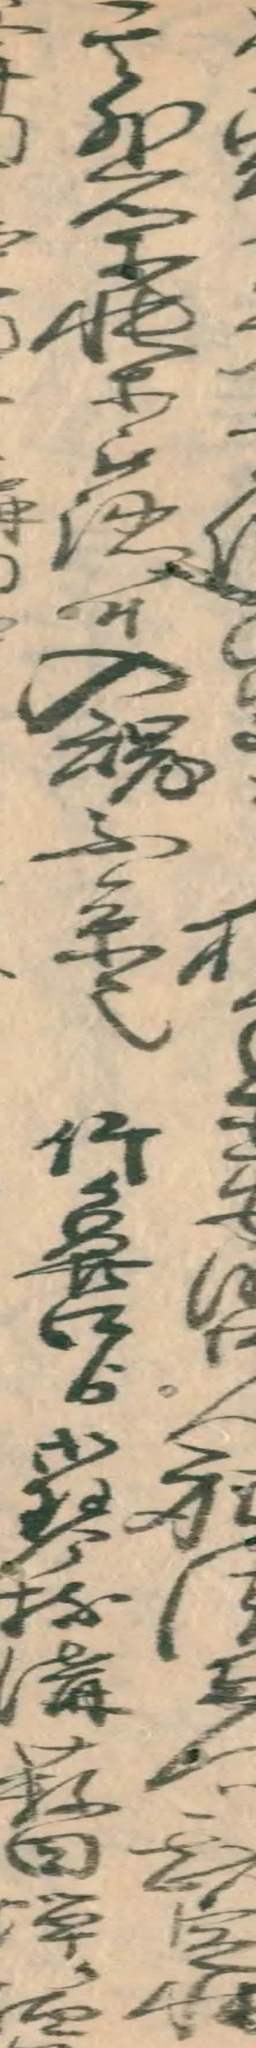其外石木帳等被認ニ付入魂不参也竹か鼻口ゟ御琴持溝薮田蝉か垣内
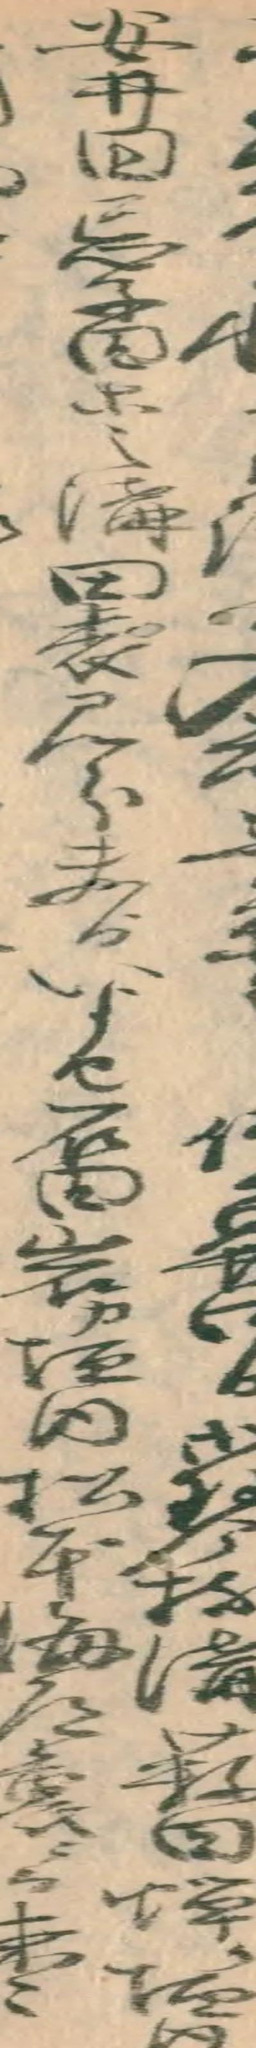安井田忌子田等之溝田表見分夫ゟいよセ石田岩カ垣内松本海道裏ニ而束々
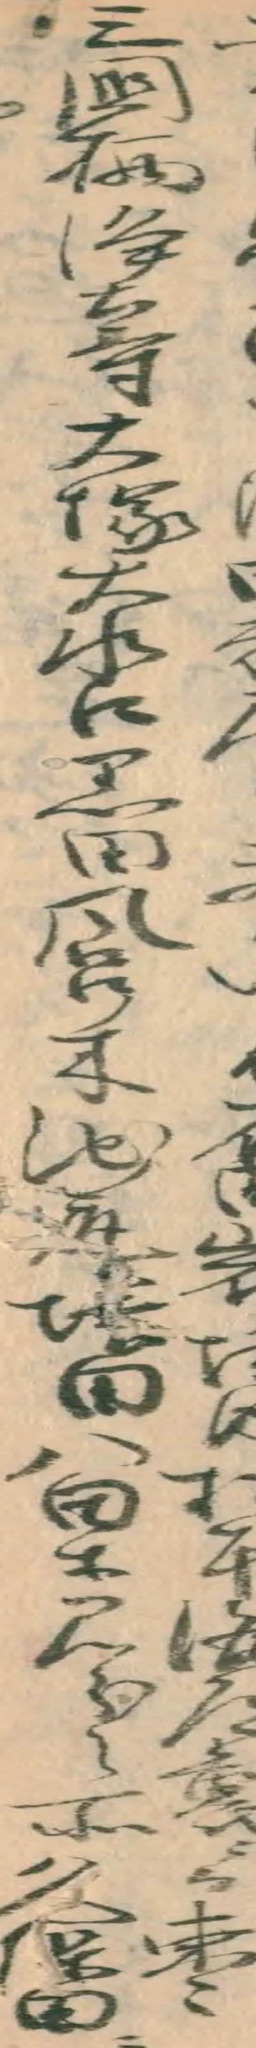三国栖浄土寺大塚大水口黒田風呂ノ木池尻塔田八田等見分之所久保田ニ
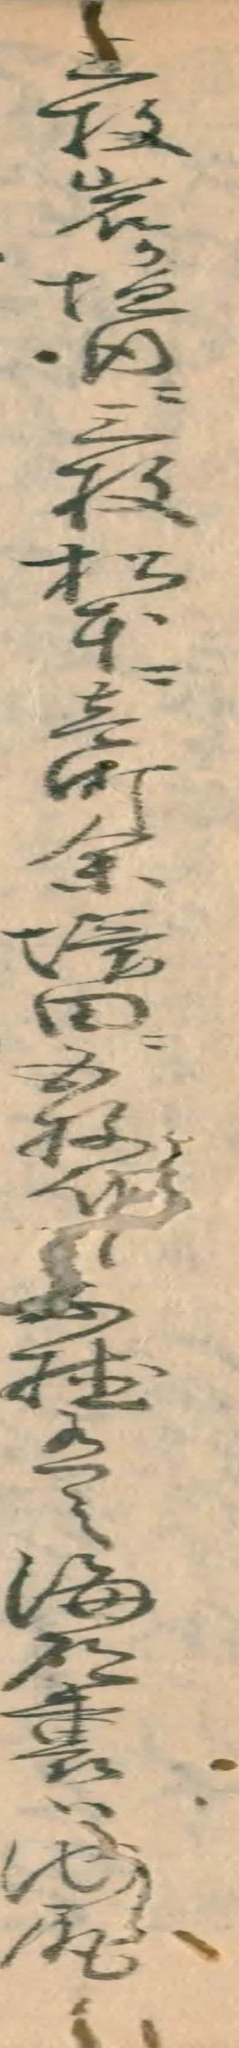三枚岩か垣内ニ三枚松本ニ壱町余塔田ニ五枚ほと不植有之海道裏ハ池尻
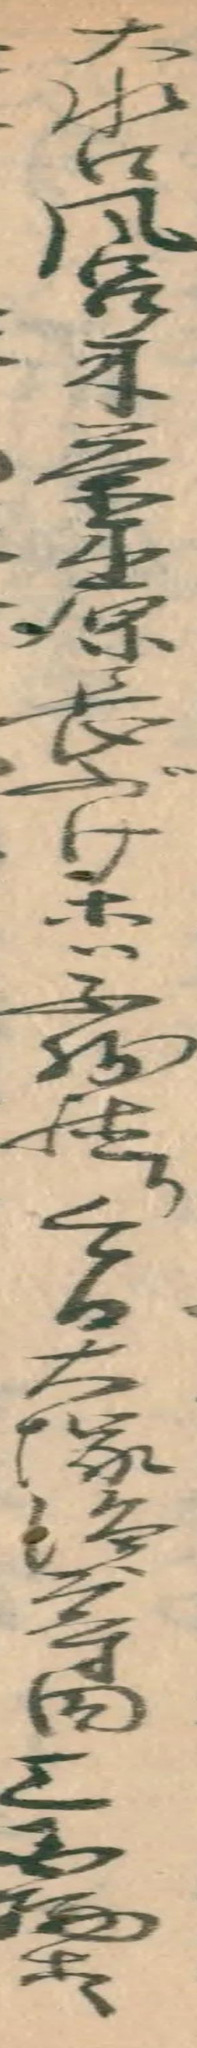大水口風呂ノ木茶木原長ぶけ等ハ不残植り今日大塚浄土寺田三国栖等へ
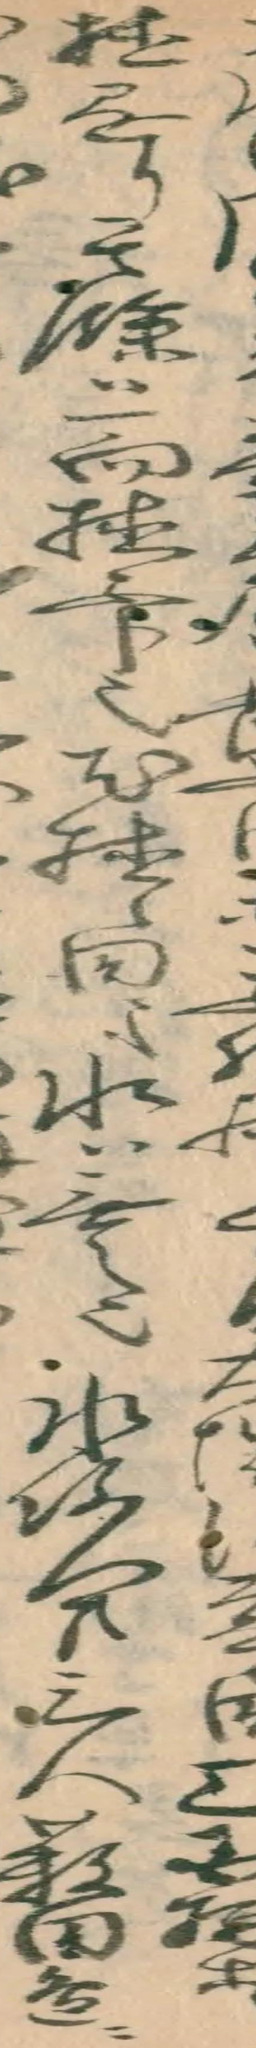植懸り其余ハ一向植不申也尤植候田ニも水ハ無之也水役人共三人薮田辺ニ
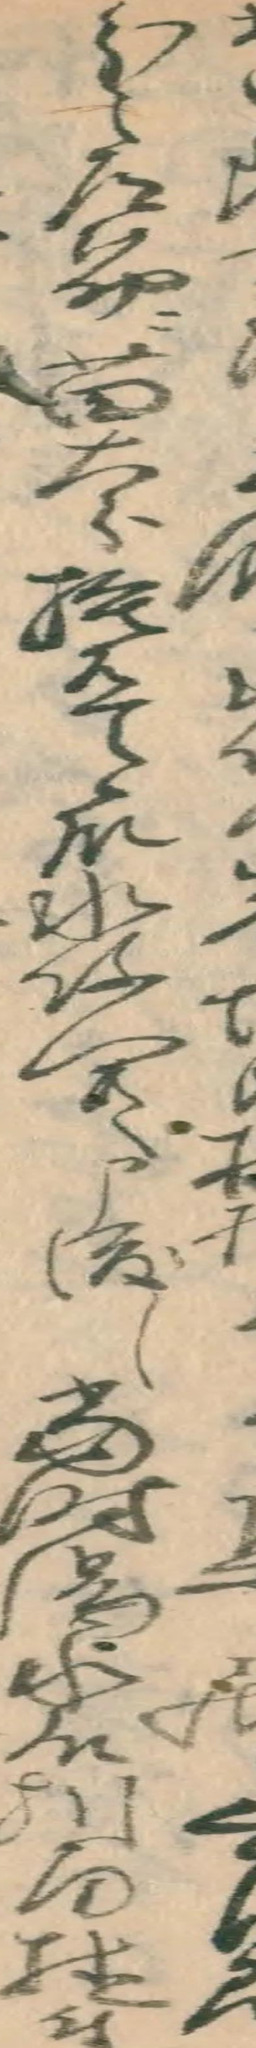分之道筋ニ苗大分捨有之候故水役人共へ申渡し当時渇水故折角植付
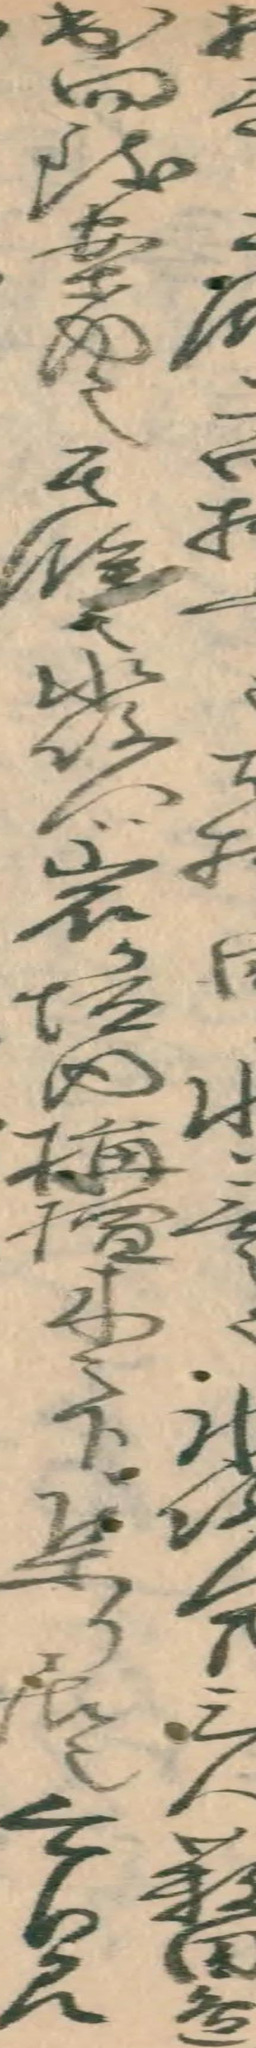出向致案内也其余之水役人ハ岩か垣内栴檀木之下ニ集り居也今日見
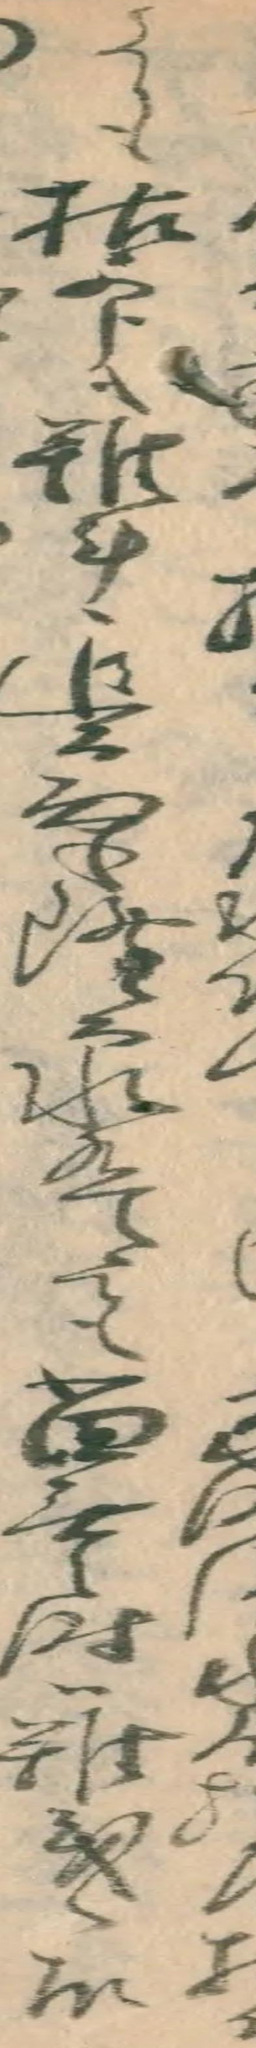候ても枯可申も難計候追而雨も降候而水有之候ても苗無之時ハ難義候故
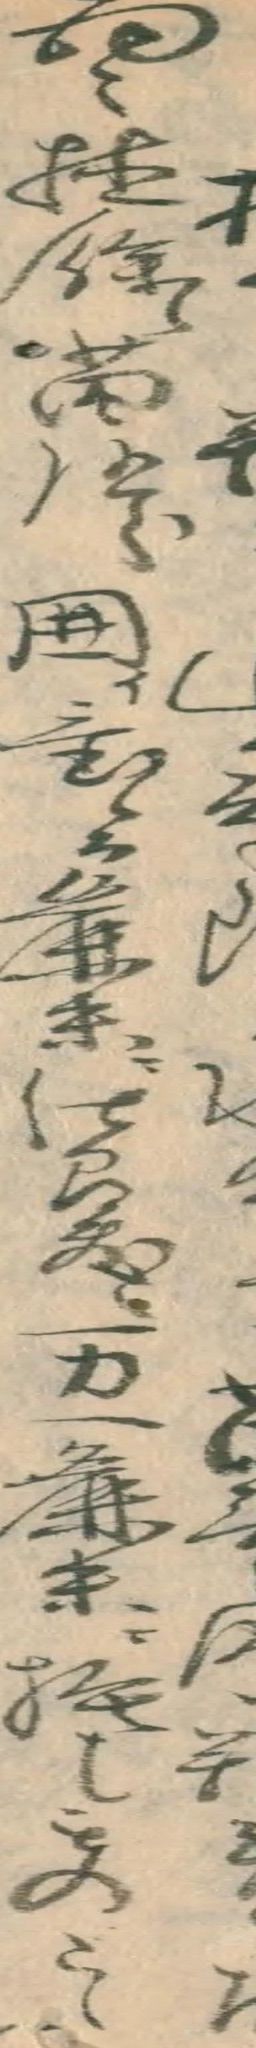面々植余候苗随分囲イ置候而麁末ニ仕間敷候万一麁末ニ捨申候もの候ハヽ
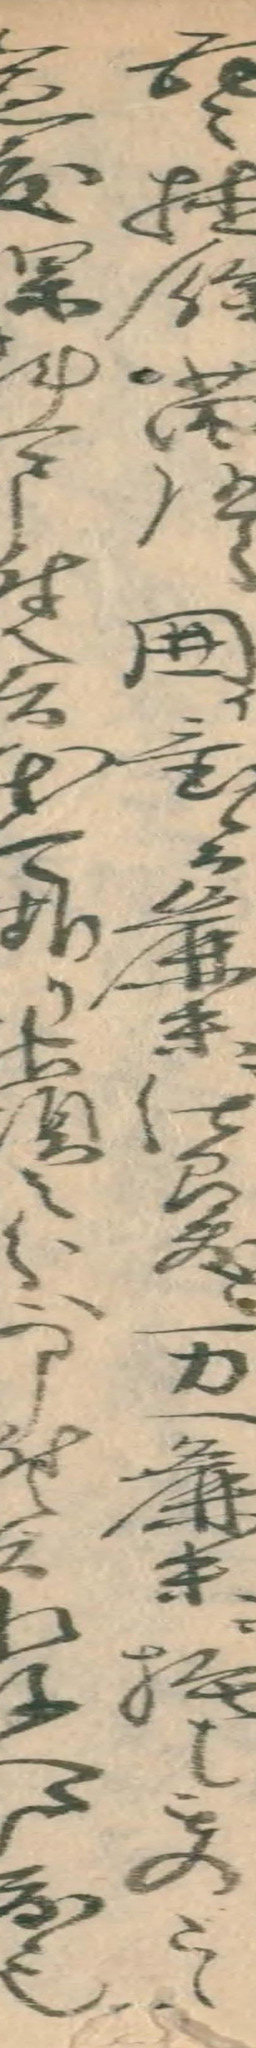急度深？料可申付之旨本郷掛り神領之分へ可申付候旨水役人へ申渡候也
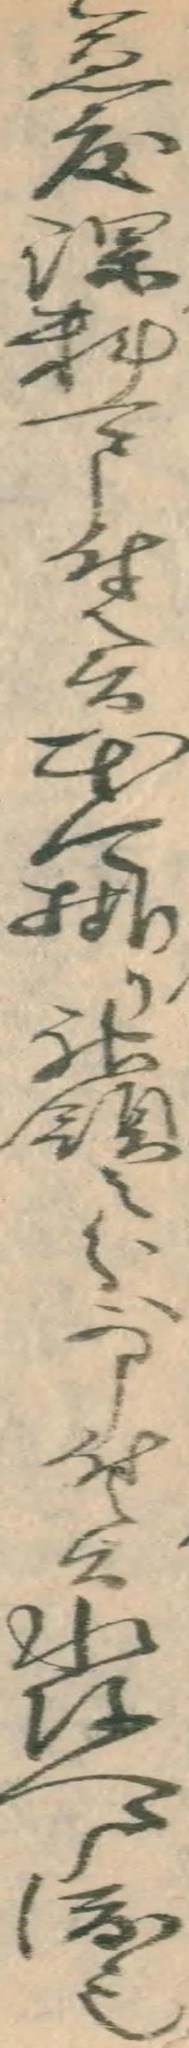急度深？料可申付之旨本郷掛り神領之分へ可申付候旨水役人へ申渡候也
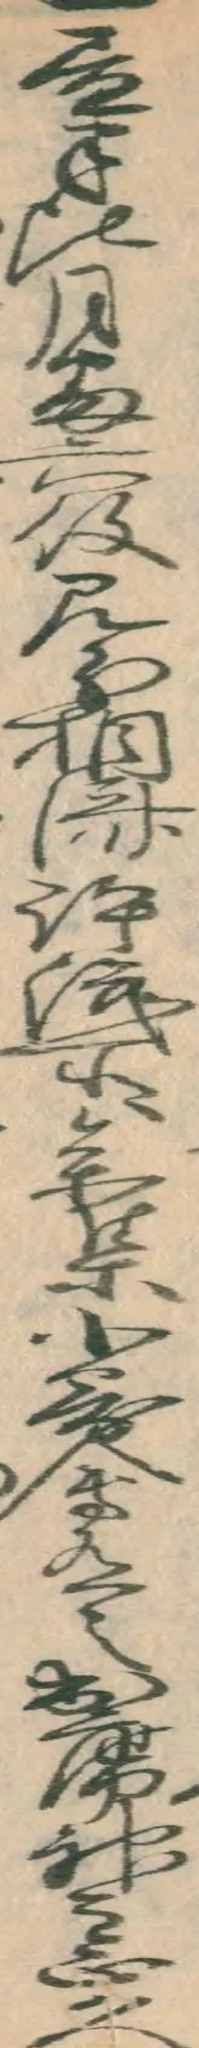一昼半比月番六役見分相済評議所へ参集小寄会有之出席神主正久
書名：賀茂社記録. 第58冊
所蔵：国立国会図書館 National Diet Library, JAPAN
